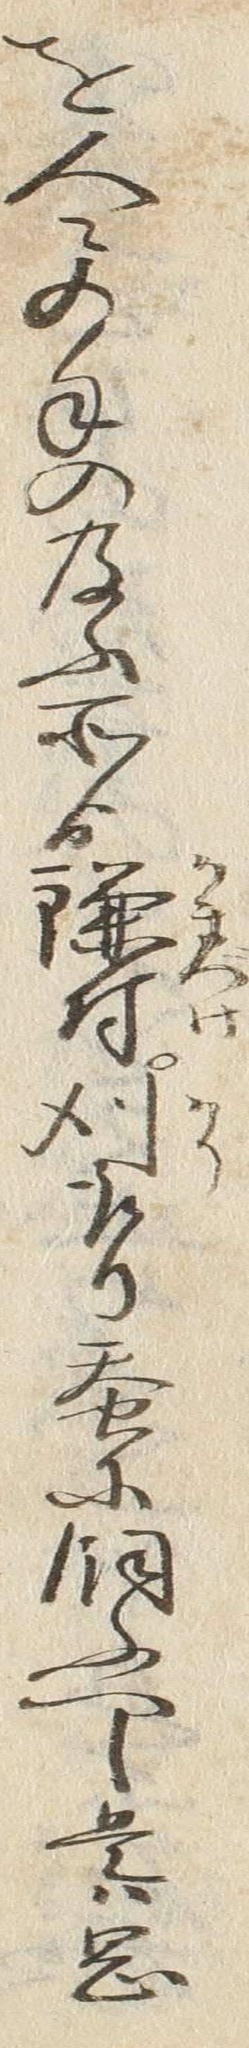を人々の手の及ふ所ゟ鎌付。刈取り蚕尓飼ふへし是は岡
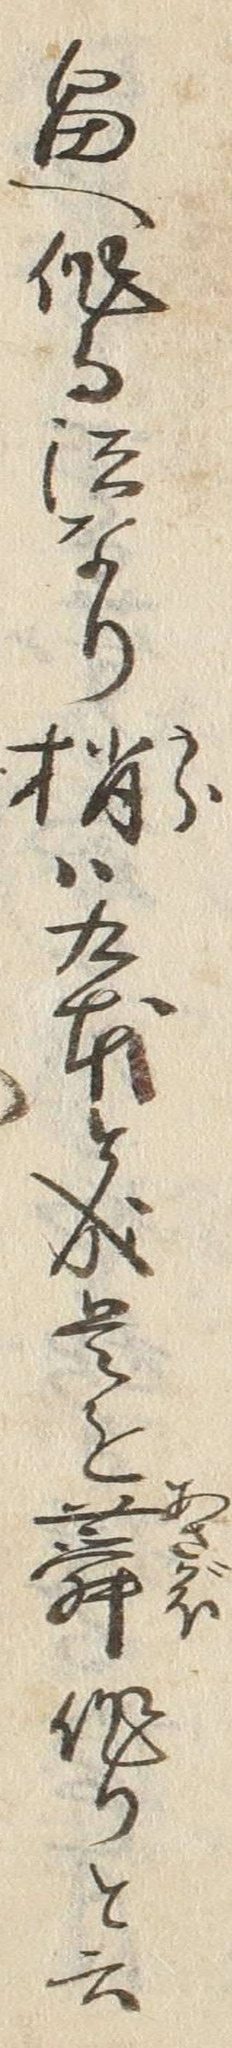畠へ作る法なり梢は九本と成是を蕣作りと云
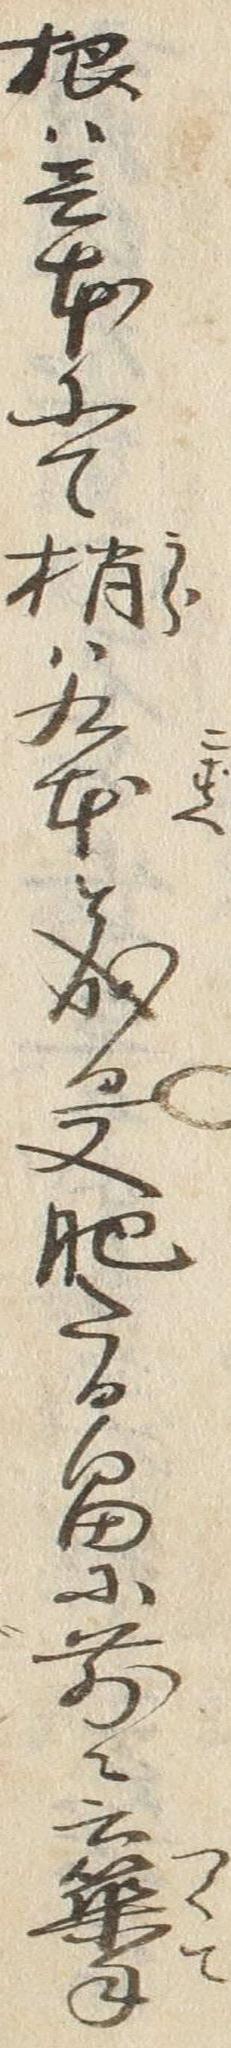根は壱本尓て梢は九本と成る〇又肥たる畠尓前々云築手
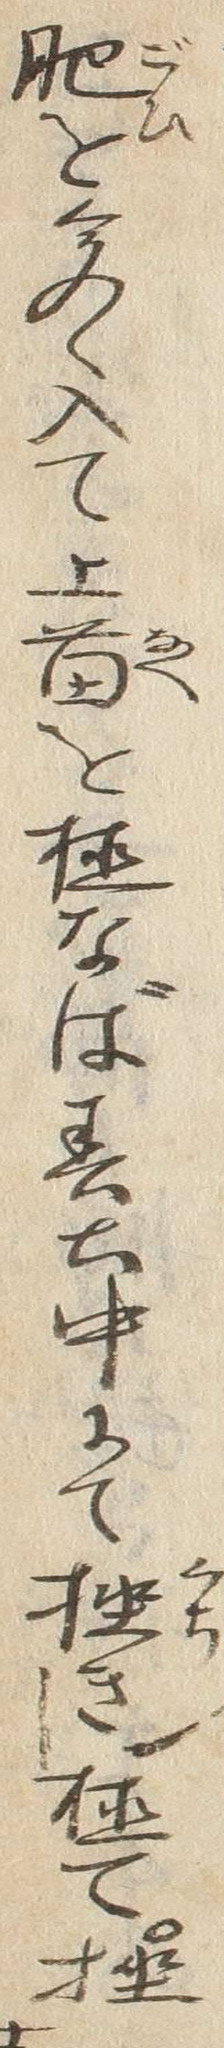肥を多く入て上苗を植なば春土中尓て挫き植て。挫

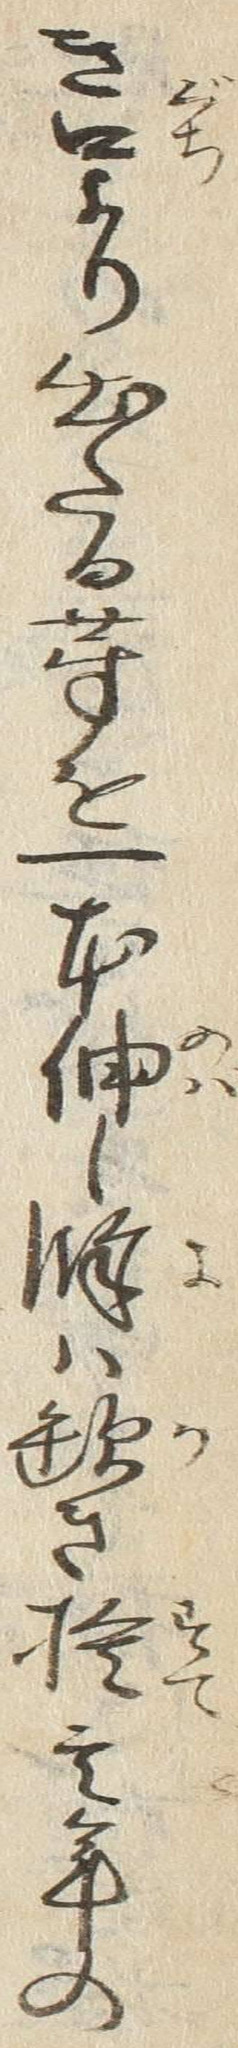き口より出たる芽を一本伸し餘は缼き捨其年の
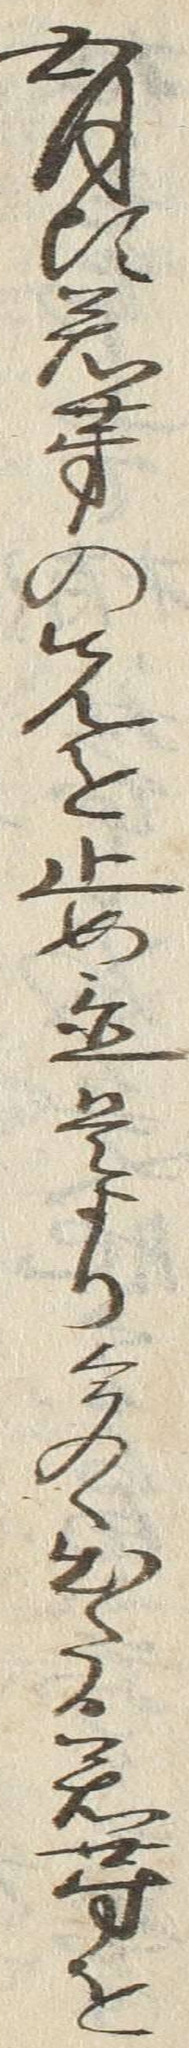五月頃若芽の先を止め置是より多く出たる若芽を
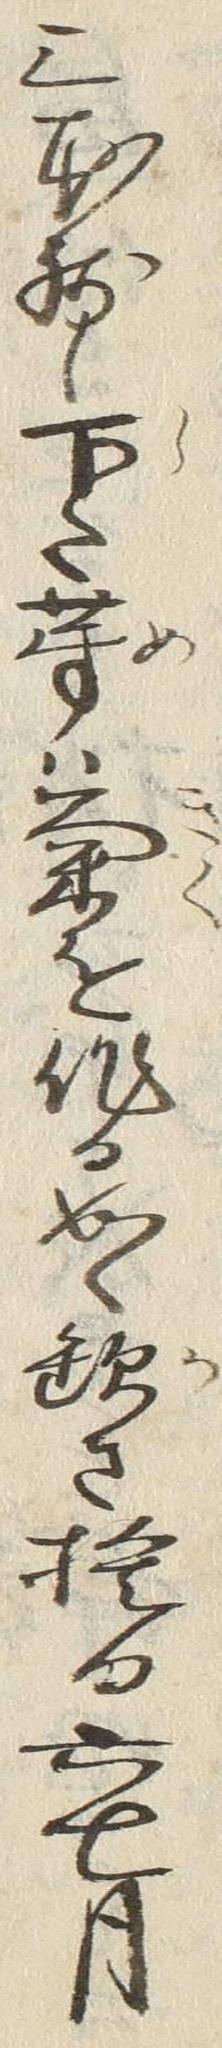三本残し下た芽は菊を作る如く缼き捨る六七月
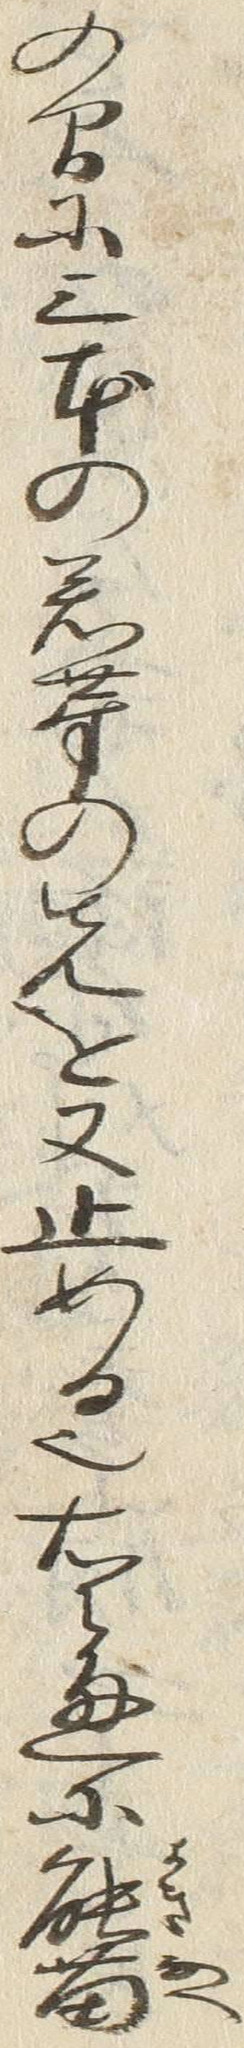の間尓三本の若芽の先を又止める也右之通尓能苗
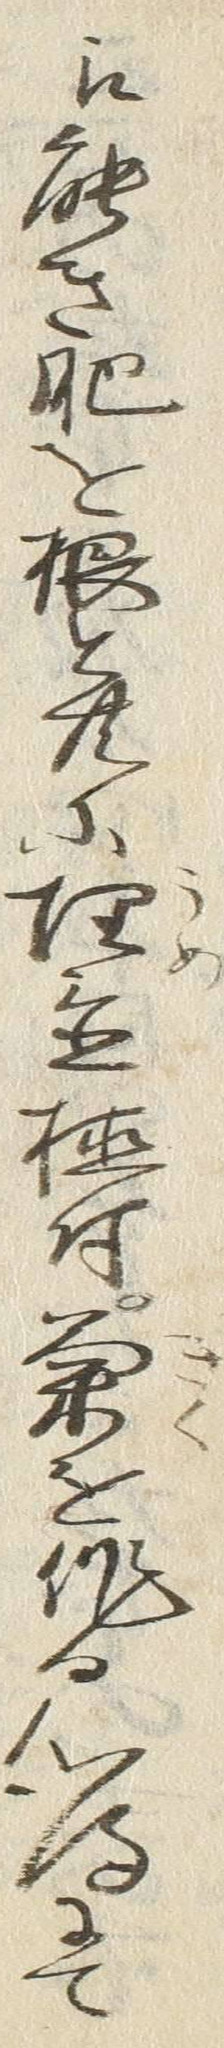江能き肥を根と共尓埋置植付。菊を作る心得尓て
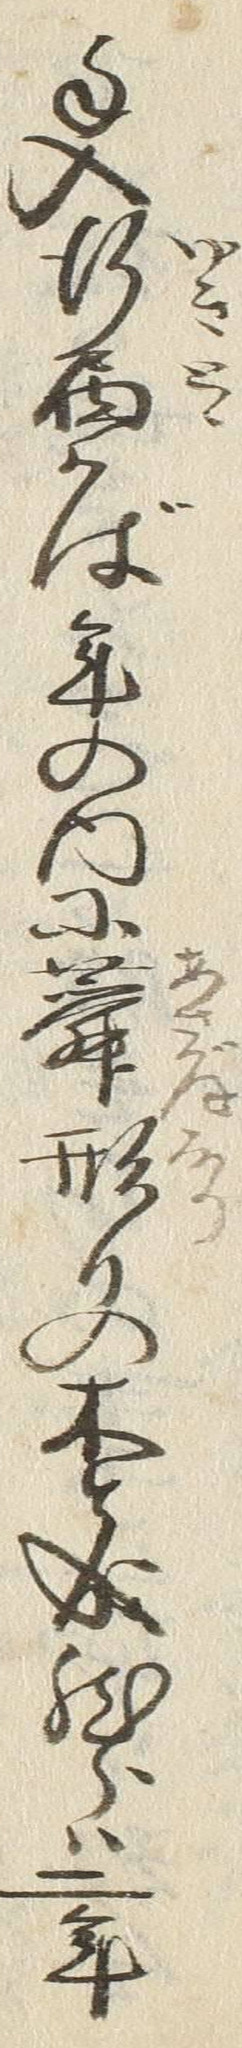手入行届かば年の内尓蕣形りの木と成然らは二年
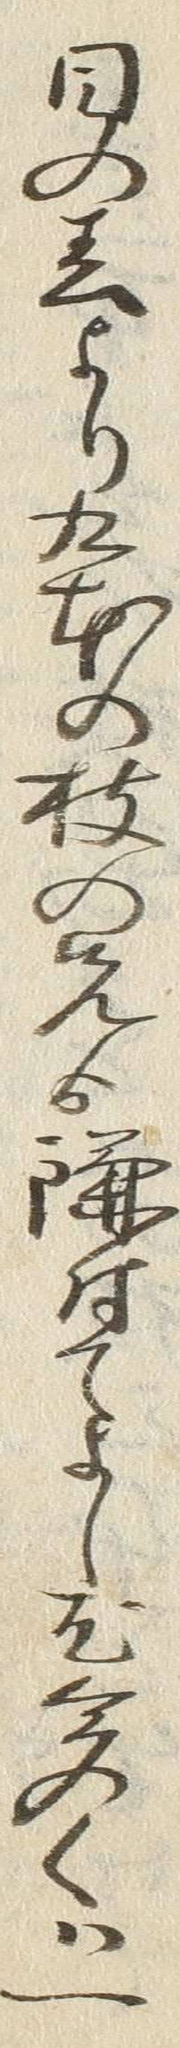目の春より九本の枝の先ゟ鎌付てよし尤多くは一
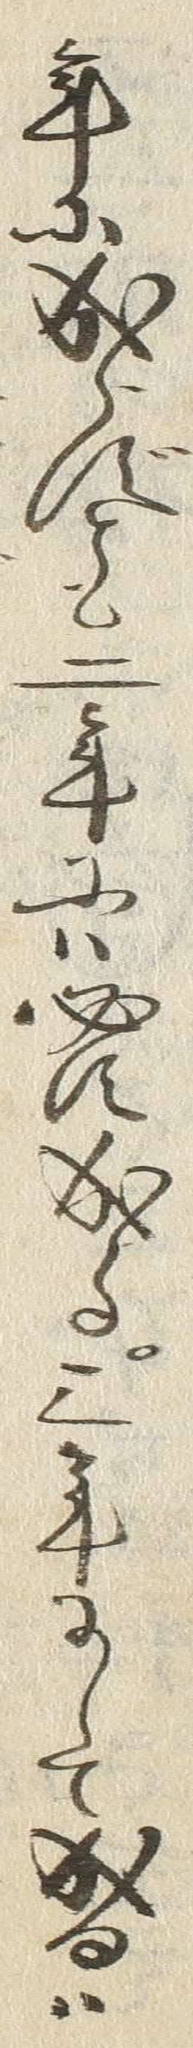年尓成らずとも二年尓は必須成る。三年尓して成るは
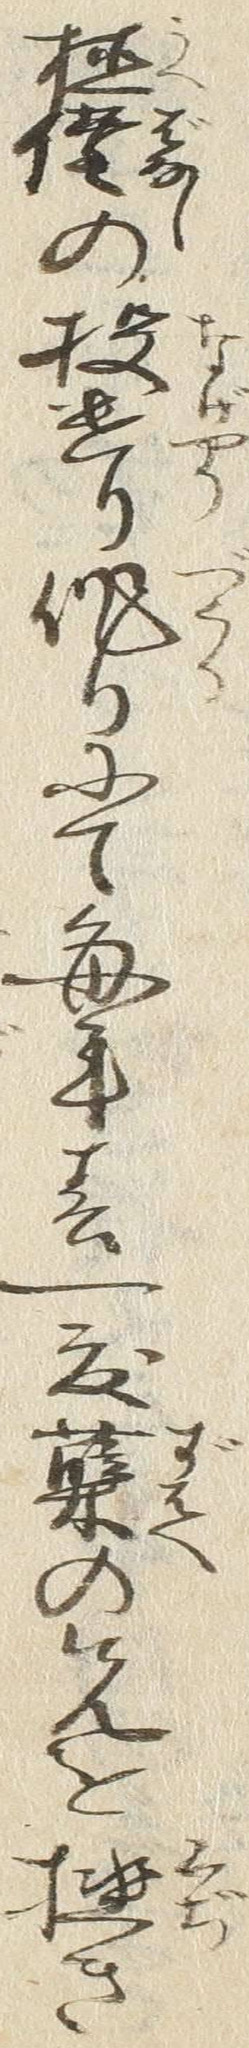植儘の投遣り作り尓て毎年春一度蘖の先を挫き
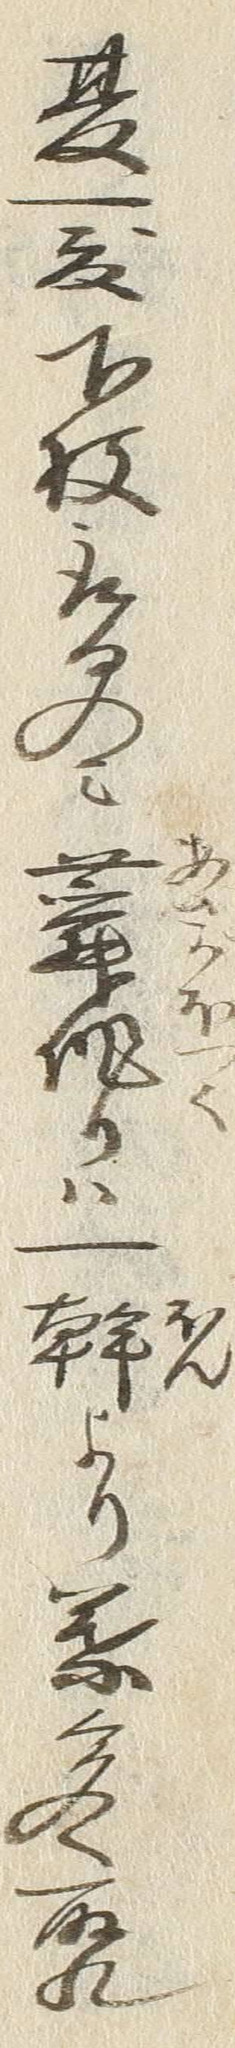夏一度下枝取るのみ蕣作りは一幹より葉多く取れ
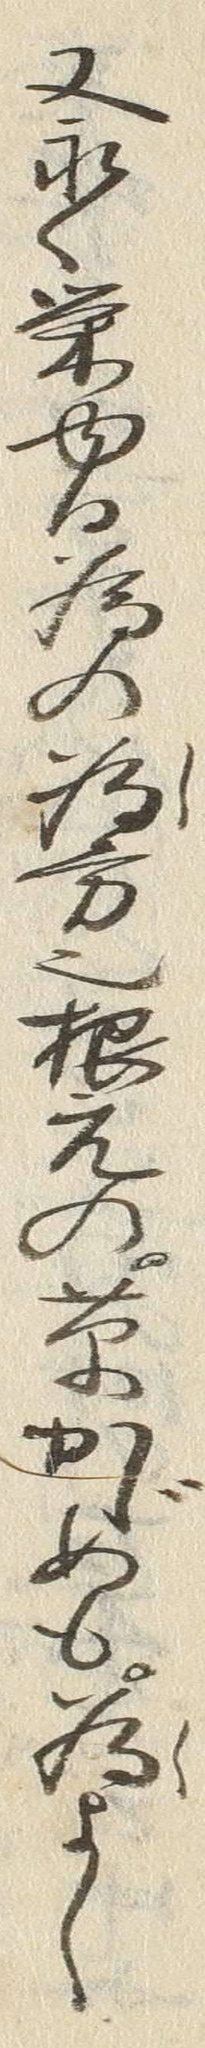又永く栄ゆる為の為方也根元の。草かじめも。為よし
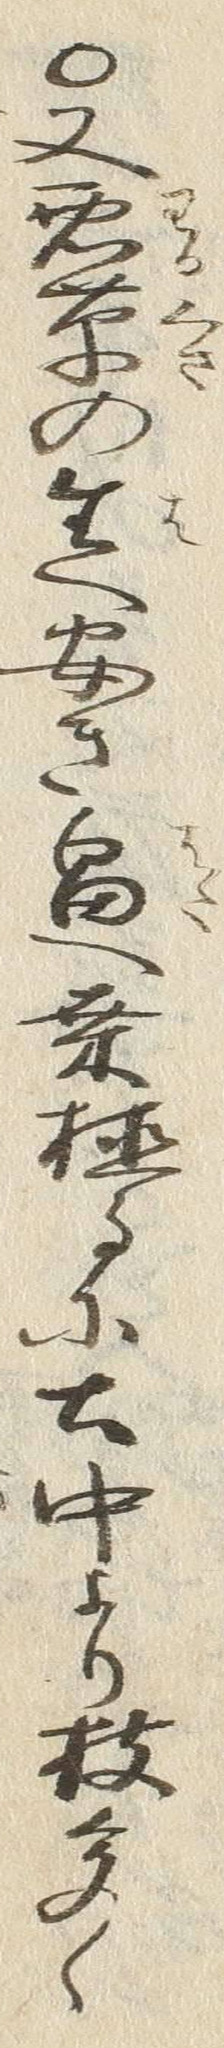〇又悪草の生へ安き畠へ桑植る尓土中より枝多く
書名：養蠶實驗録後編
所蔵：東京大学農学生命科学図書館 国文学研究資料館
